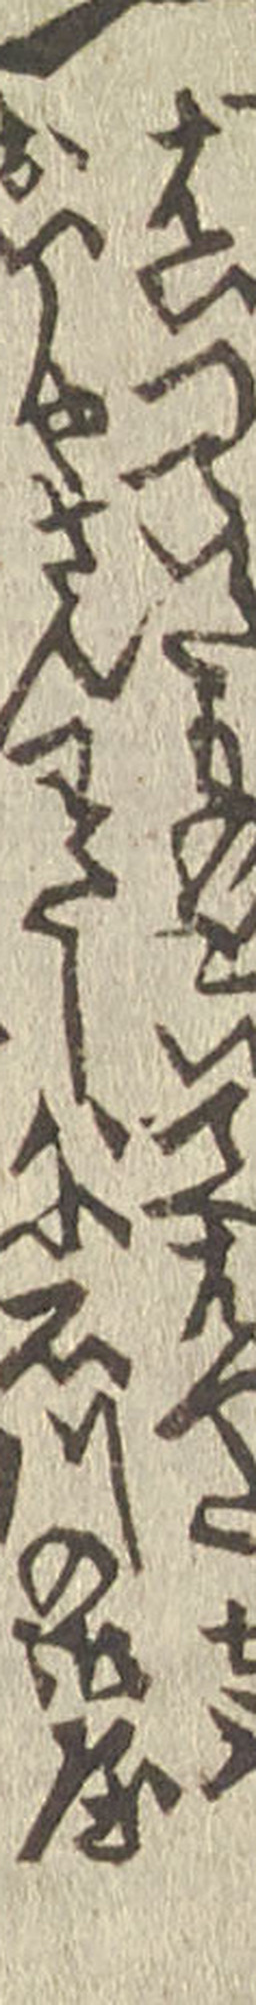おいしやさんわたしは小石川の御屋
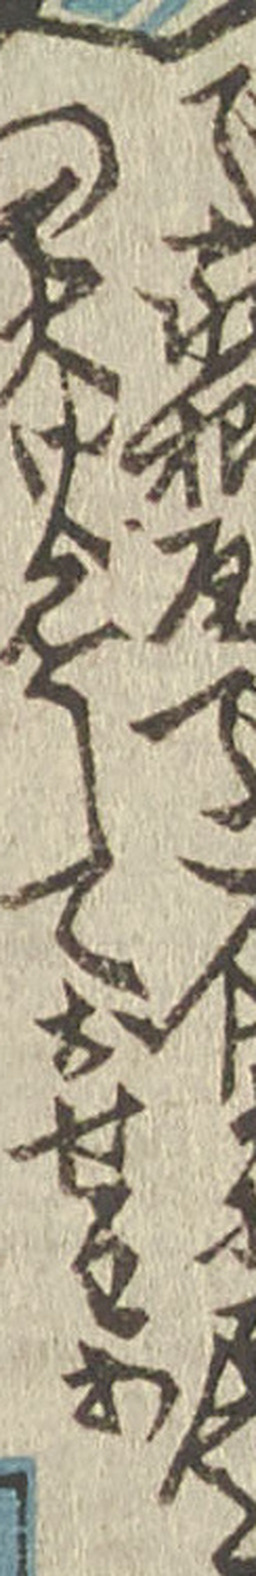つて大けがをしておせわに
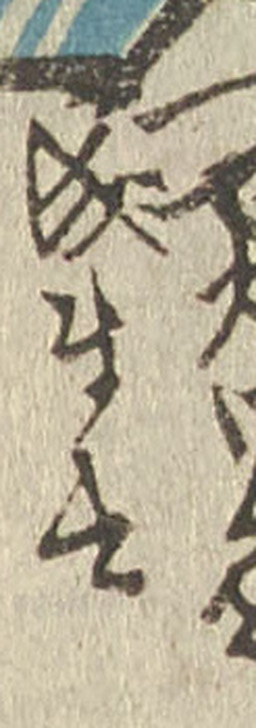成ます
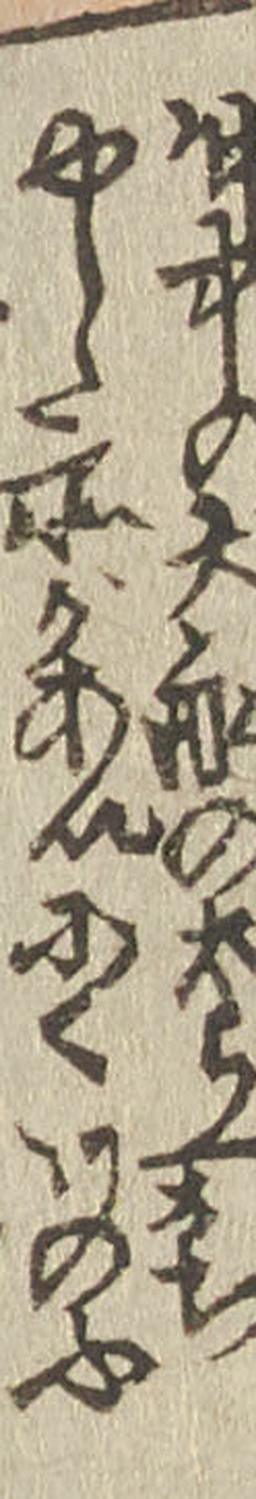やした所があいにく川のふ
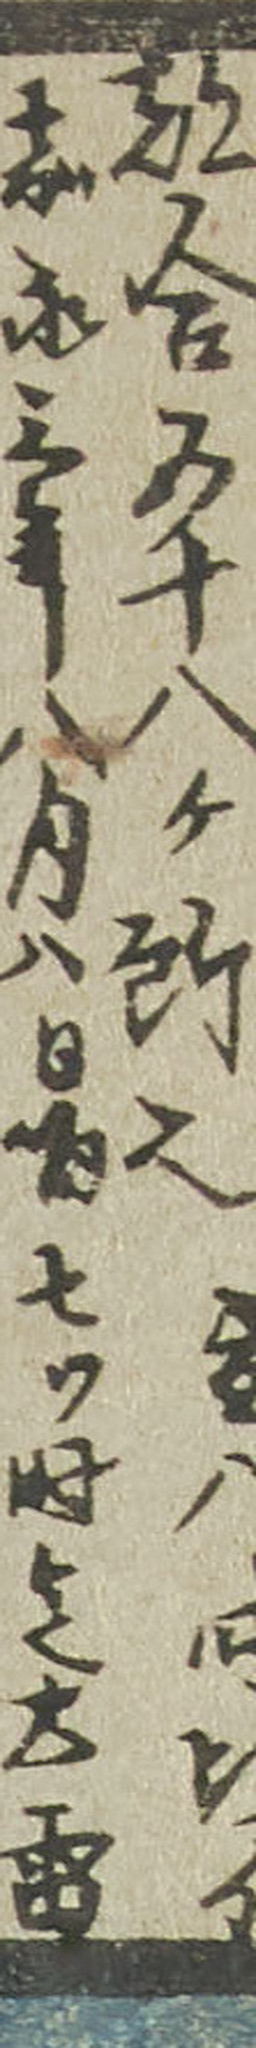嘉永三年八月八日明七ツ時迄大雷
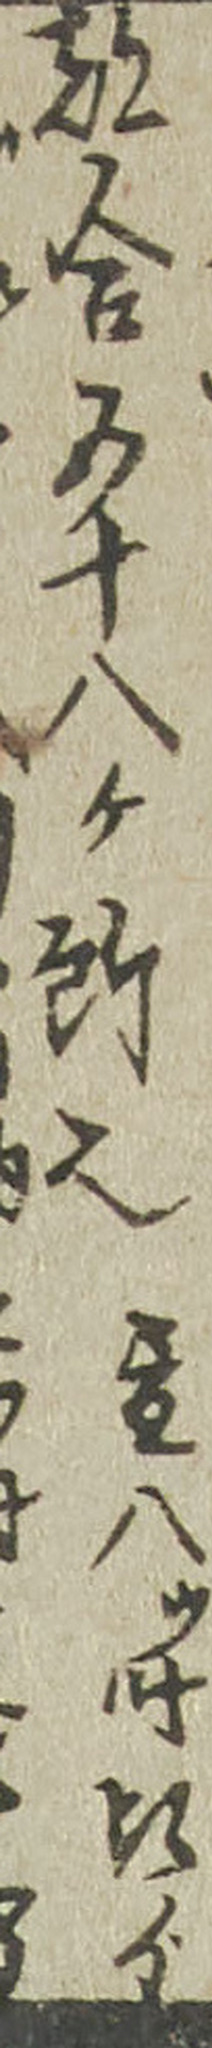都合五十八ケ所也昼八ツ時頃ゟ
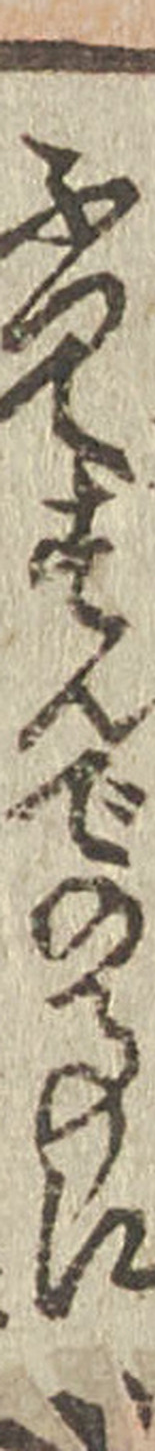ふつてすんでの事に
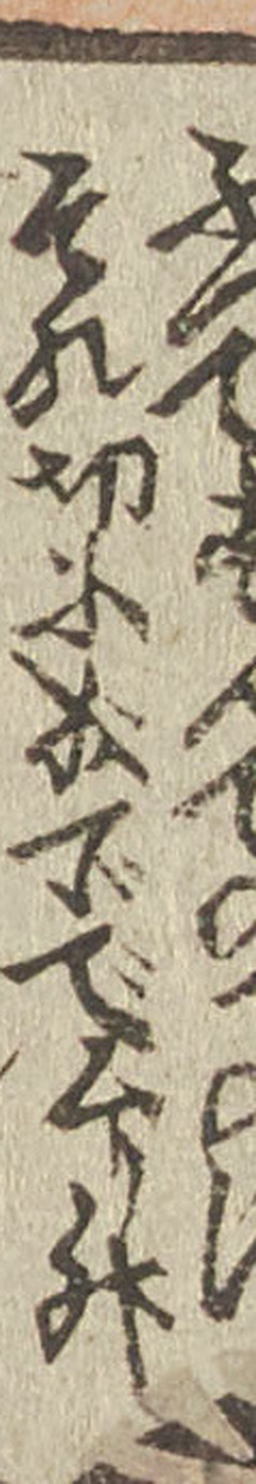それ切に成所で厶り升
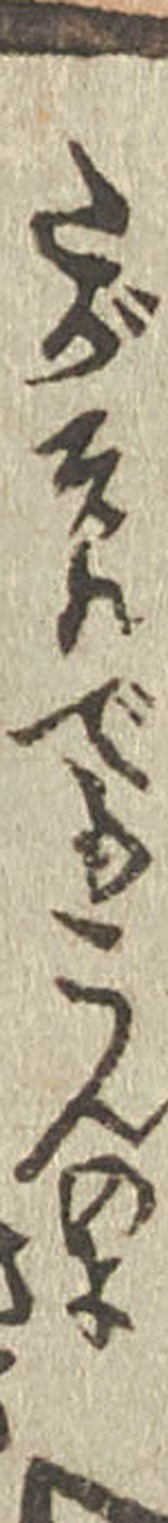だがそれでもうんのよ
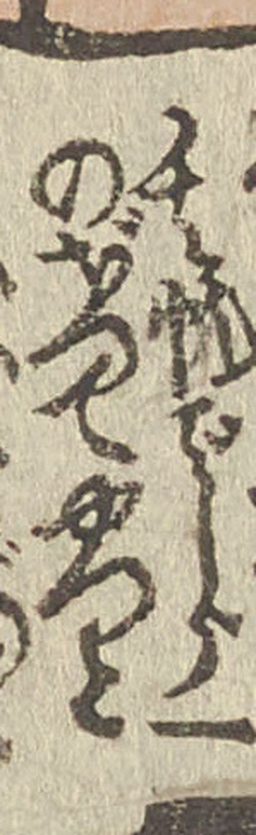のぼつてやつと
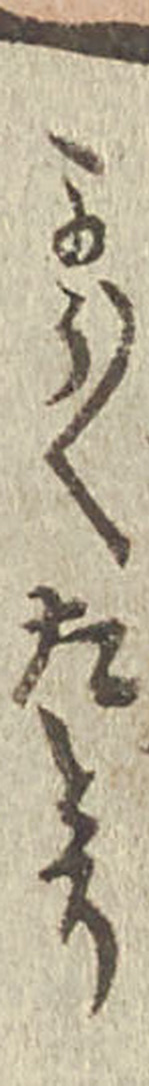よう〳〵たすかり
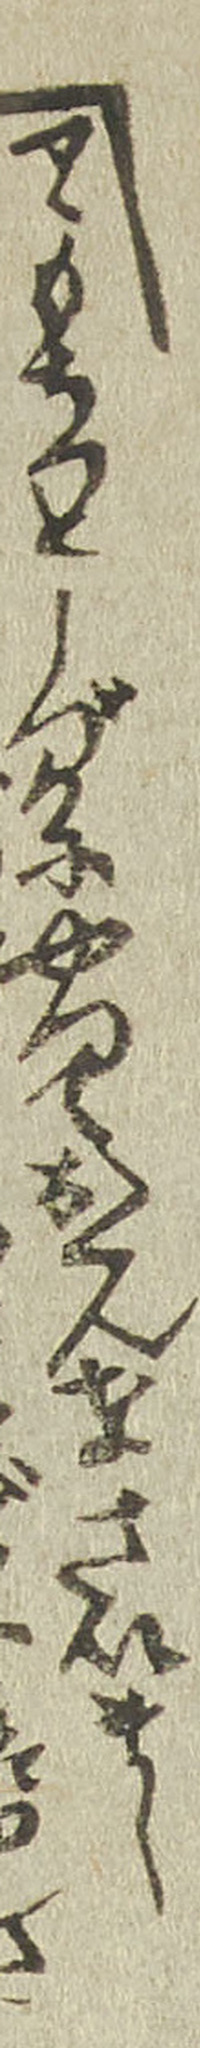｢アゝもちつとしづかにやつておくんなさいまし
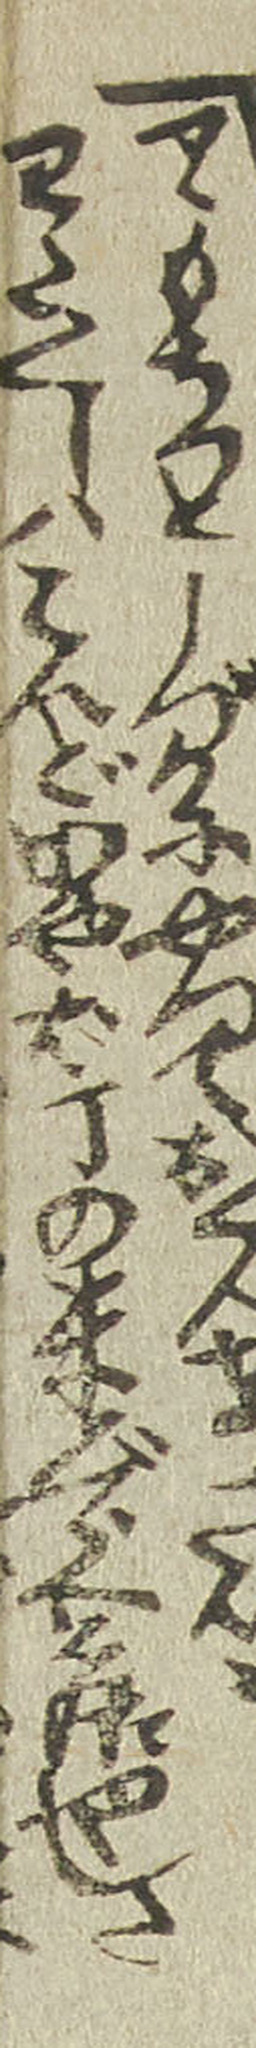わたくしはこんどかやば丁の米ぐらへ落やした
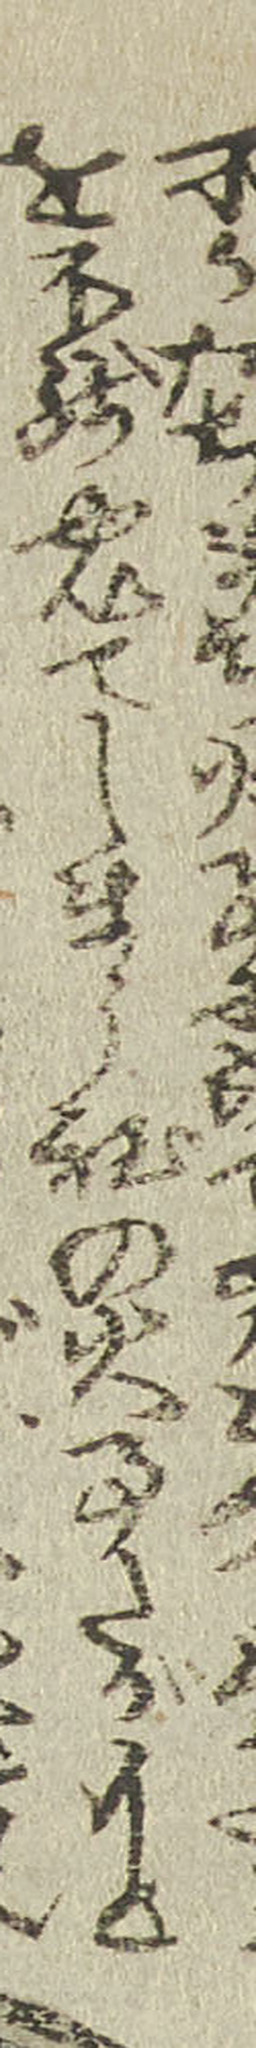を不残やいてしまう程の火事たがもと
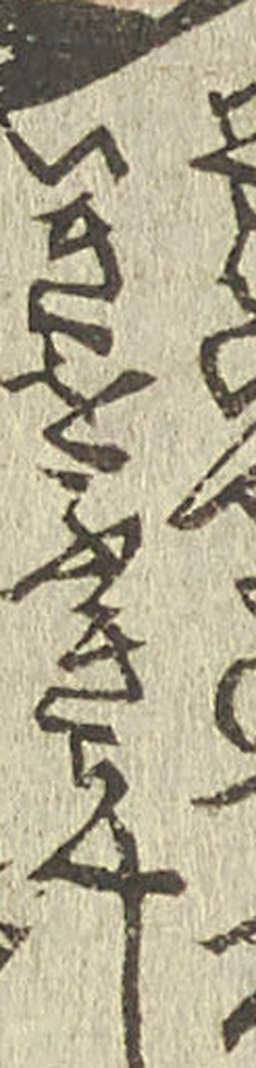いきをふきかへし
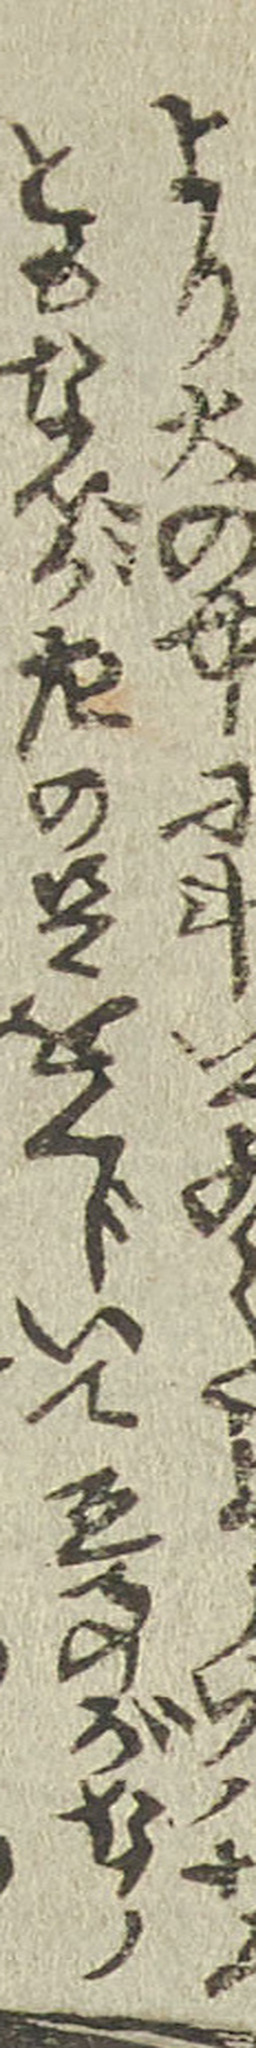ともないが左の足をくじいて走事がなら
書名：[外科骨折泥鏝療治]
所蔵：東京大学総合図書館 General Library in the University of Tokyo, JAPAN
